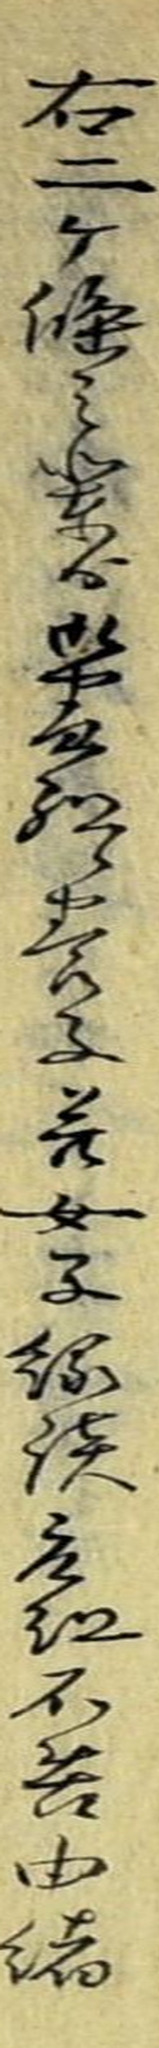右二ケ条之輩ゟ御番組へ養子并女子縁談取組不苦由緒
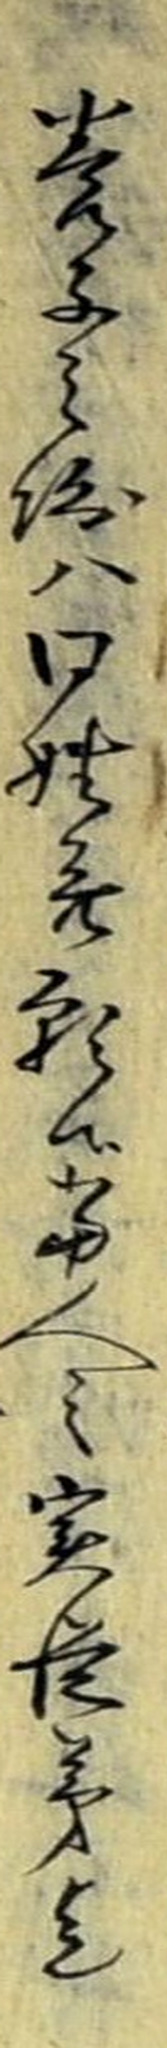養子之儀ハ同姓并願候当人之実従弟迄
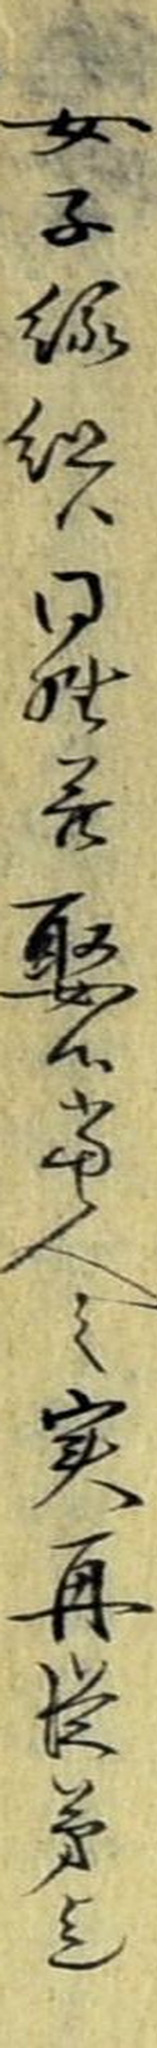女子縁組ハ同姓并娶候当人之実再従弟迄
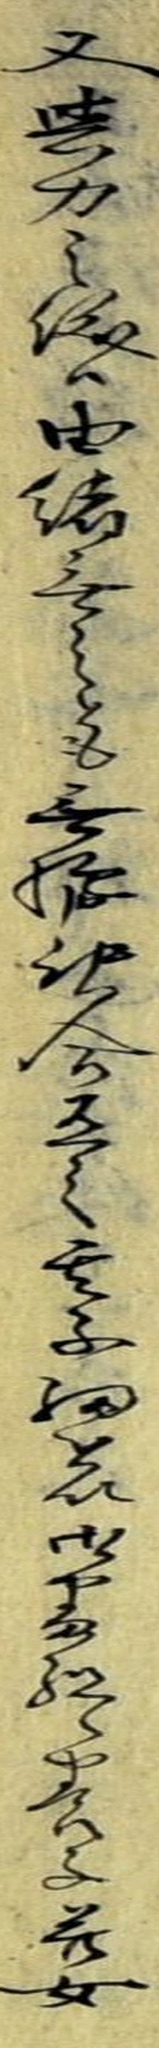又与力之儀ハ由緒無之とも無拠訳合有之其子細を以御番組へ養子并女

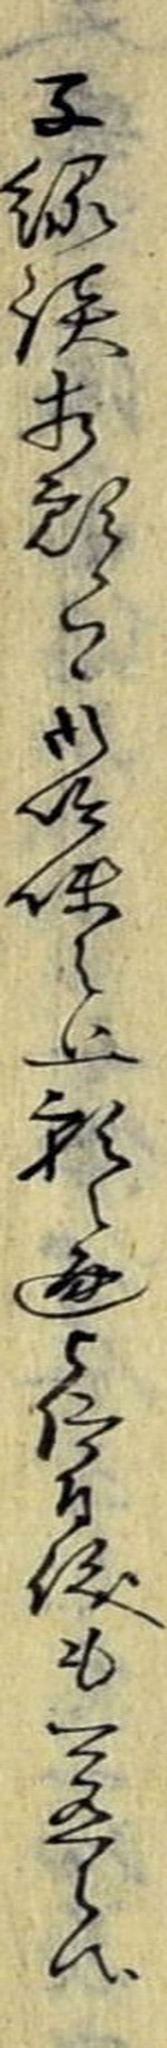子縁談相願候ハヽ御吟味之上願之通被仰付儀も可有之候
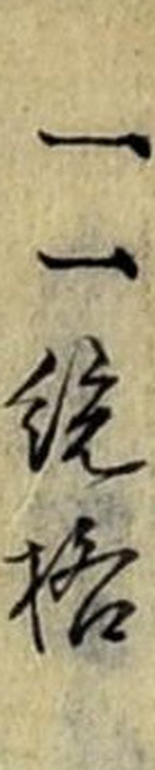一一統格
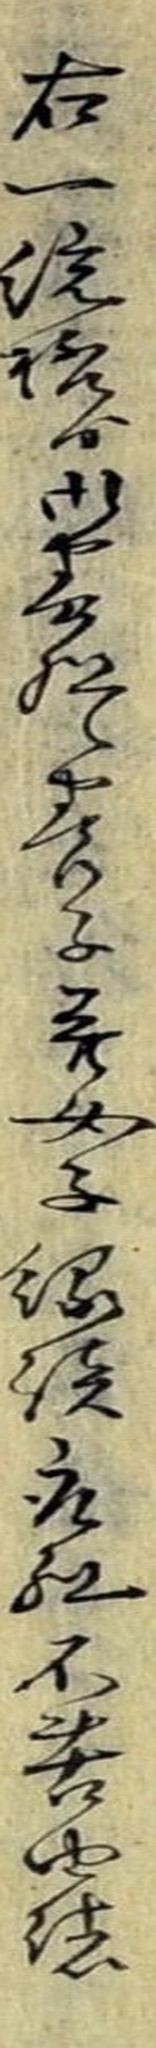右一統格ゟ御番組へ養子并女子縁談取組不苦由緒
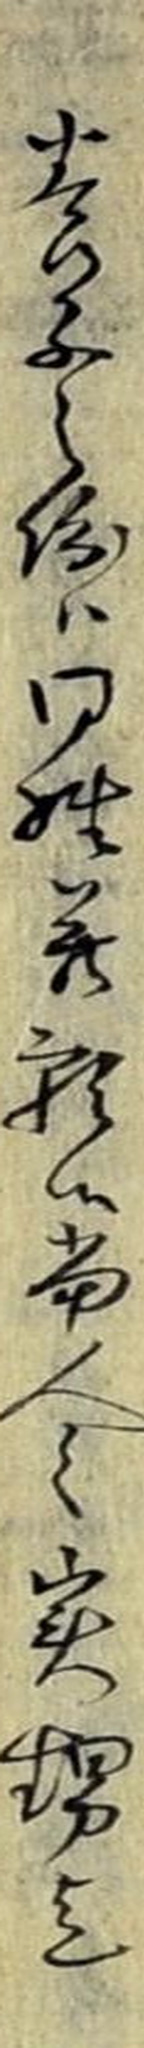養子之儀ハ同姓并願候当人之実甥迄
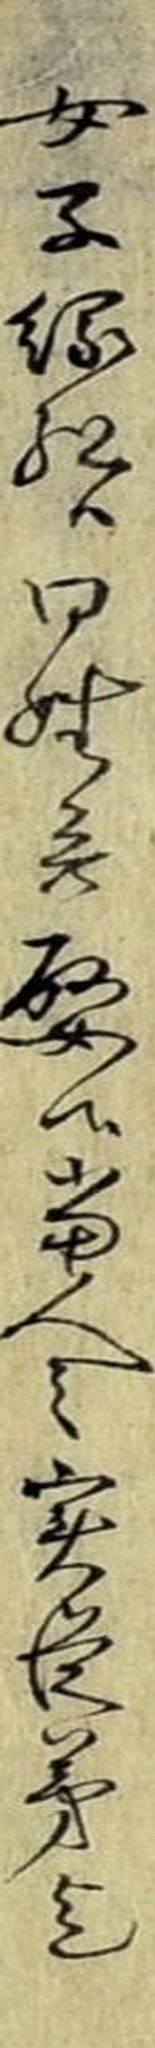女子縁組ハ同姓幷娶候当人之実従弟迄
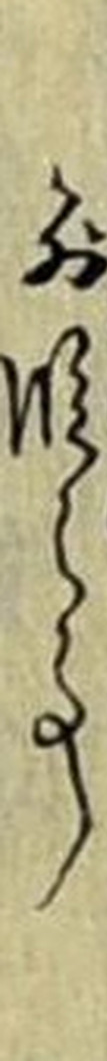別段之事
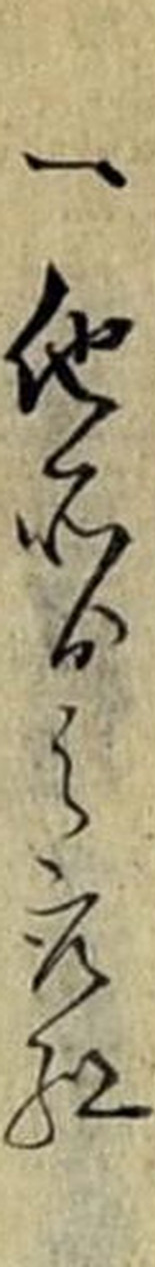一他所ゟ之取組
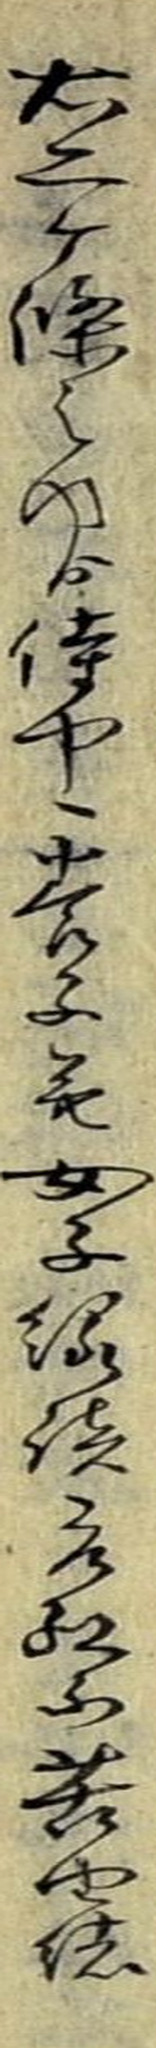右二ケ条之内ゟ侍中へ養子并女子縁談取組不苦由緒
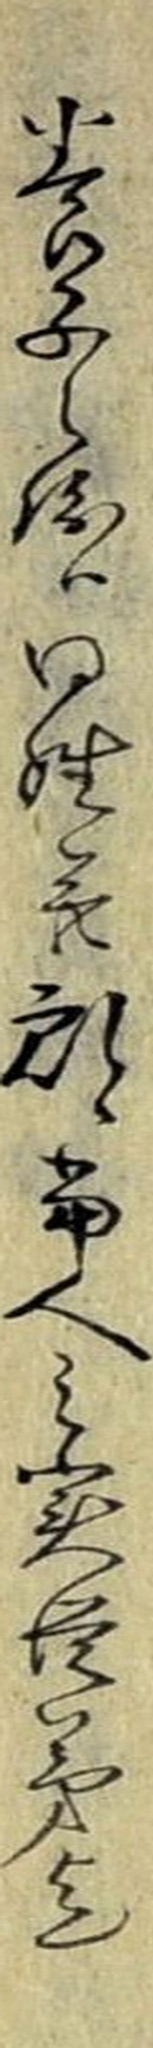養子之儀ハ同姓并願候当人之実従弟迄
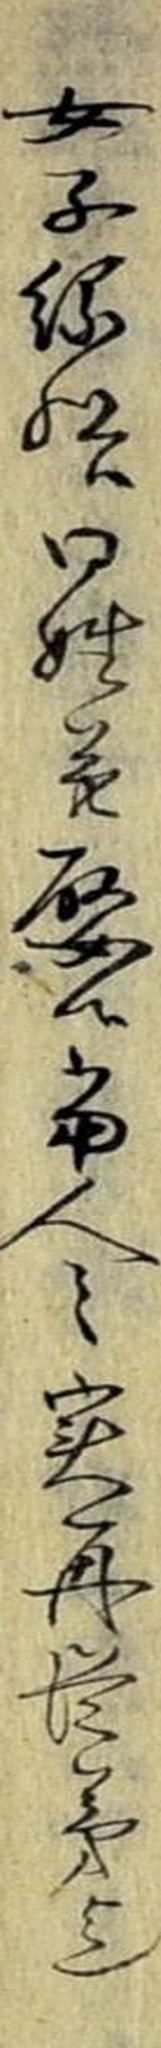女子縁組ハ同姓幷娶候当人之実再従弟迄
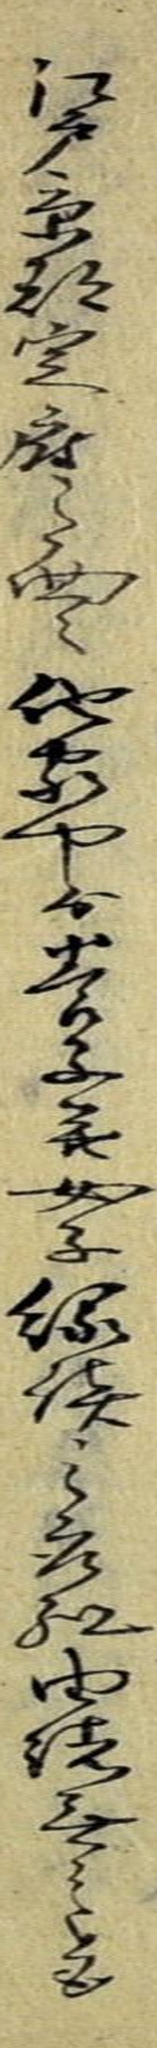江戸京都定府之面々他家中ゟ養子并女子縁談之取組由緒無之とも
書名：命令之部 三
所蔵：福井県文書館 Fukui Prefectural Archives
